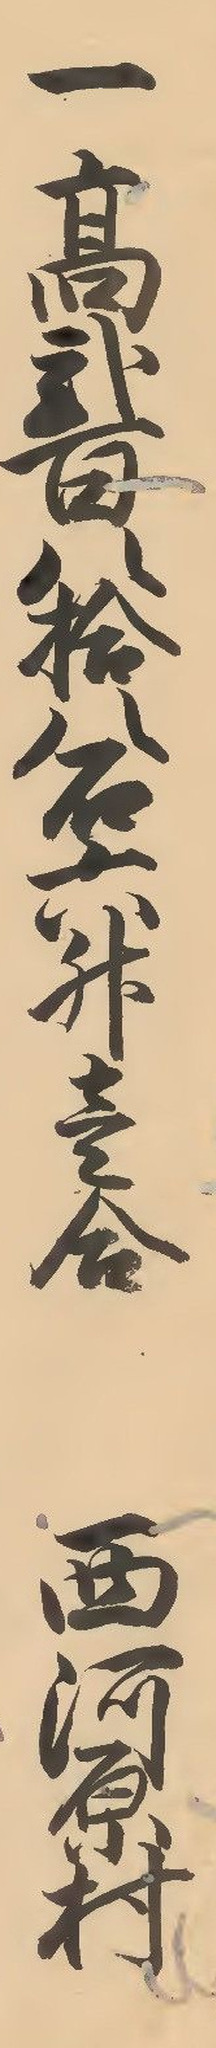一髙弐百八拾八石六升壱合西河原村
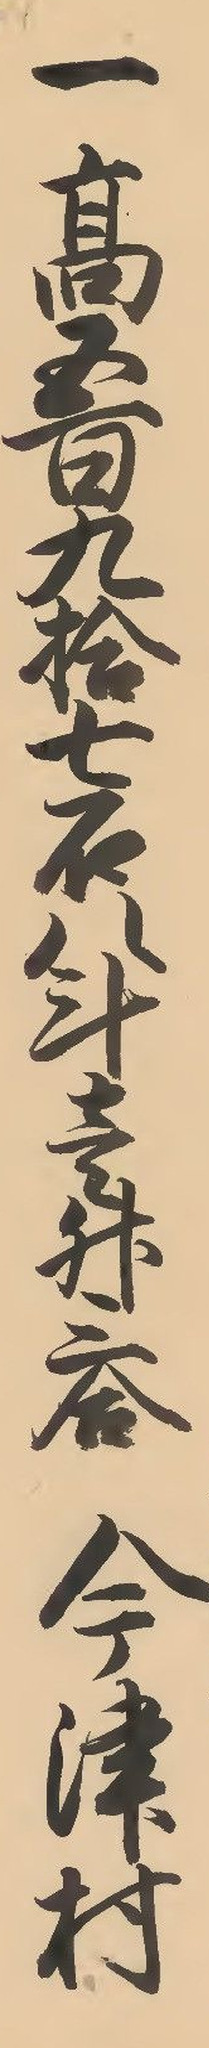一髙五百九拾七石八斗壱升三合今津村
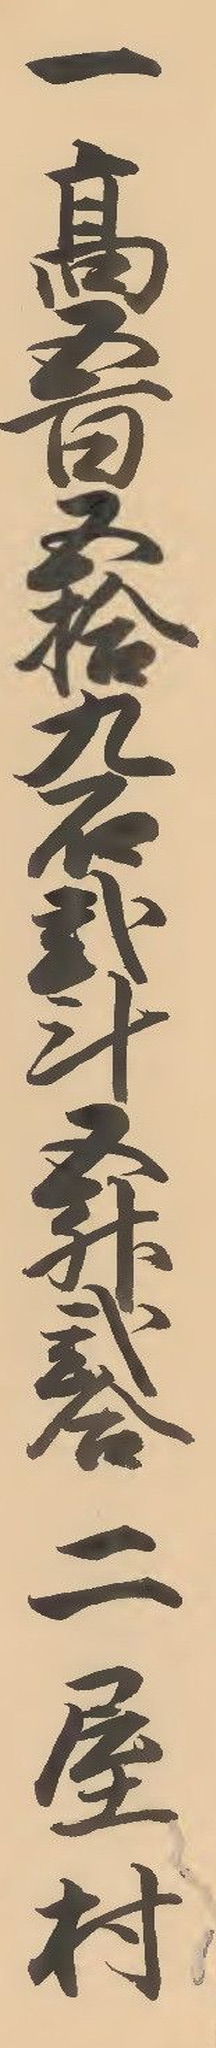一髙五百五拾九石弐斗五升弐合二屋村
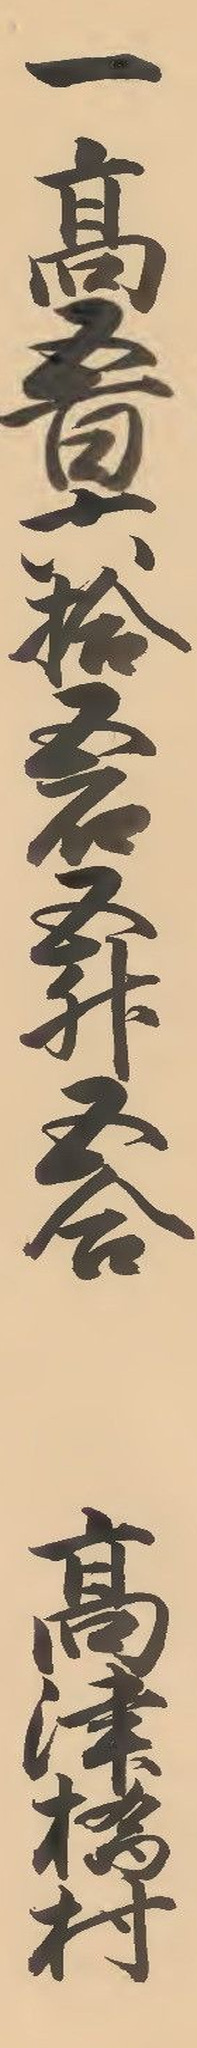一髙五百六拾五石五升五合髙津橋村
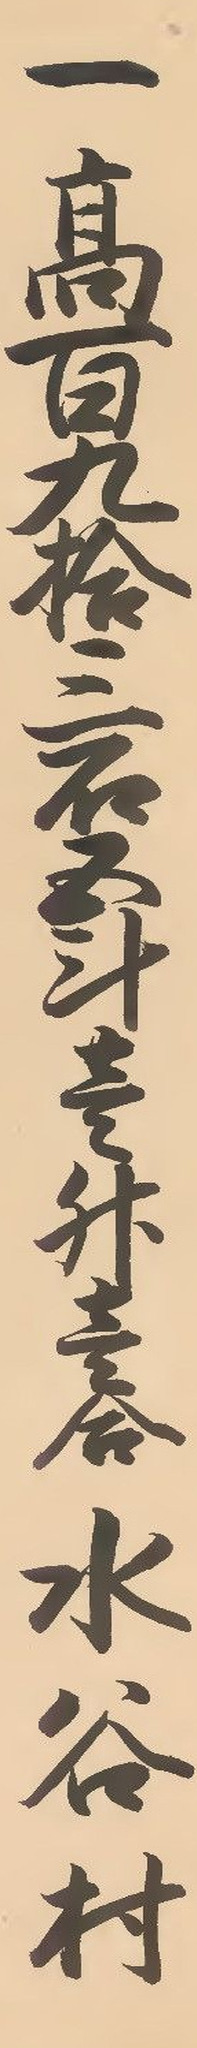一髙百九拾三石五斗壱升壱合水谷村
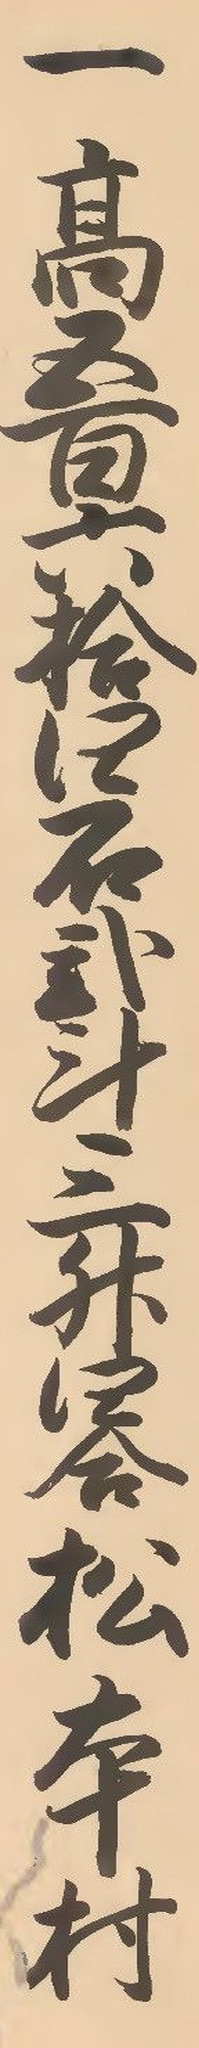一髙五百六拾四石弐斗三升四合松本村
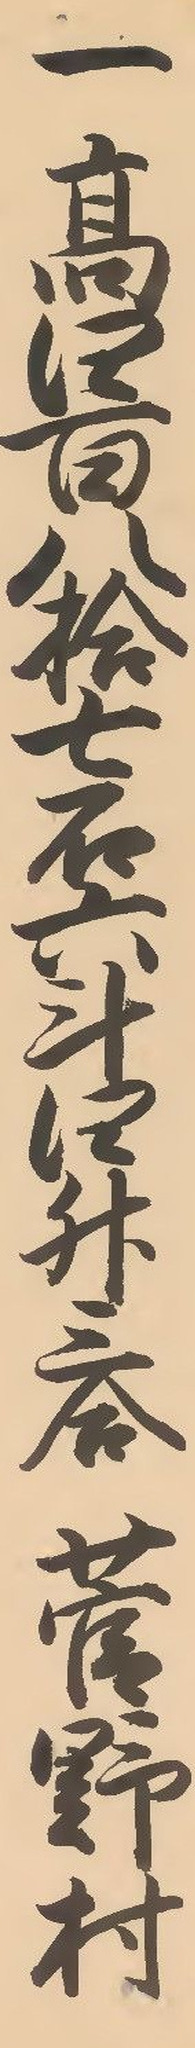一髙四百八拾七石六斗四升三合菅野村
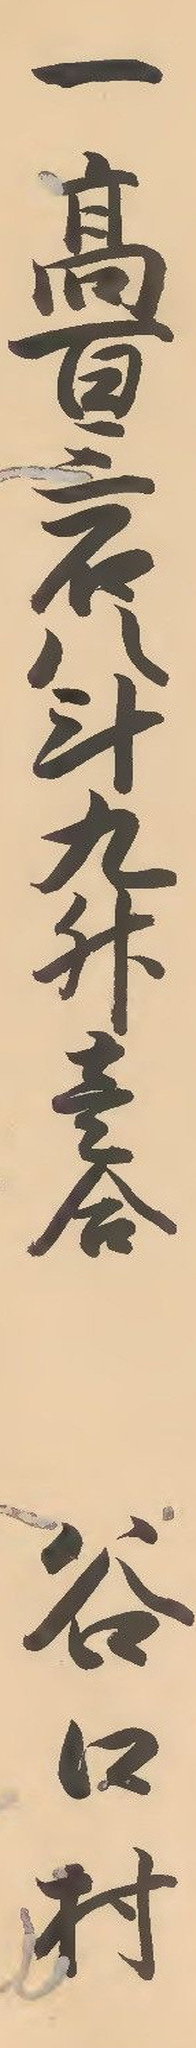一髙百三石八斗九升壱合谷口村

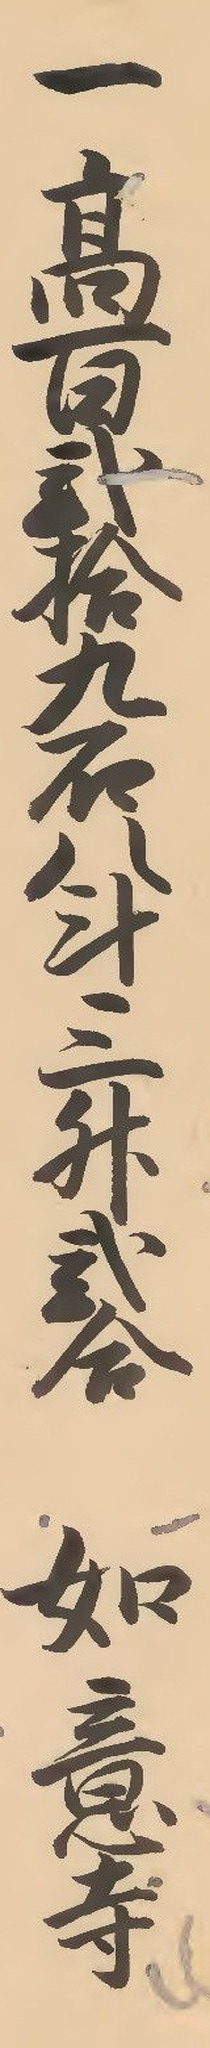一髙百弐拾九石八斗三升弐合如意寺
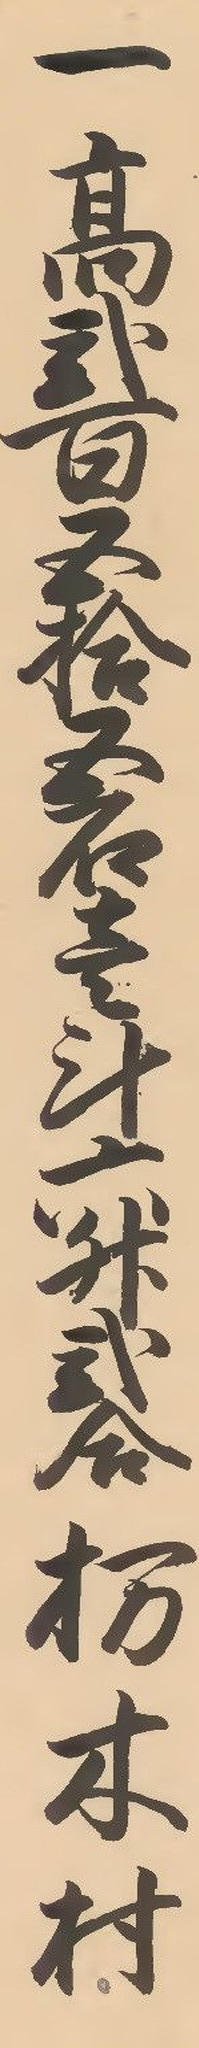一髙弐百五拾五石壱斗六升弐合杤木村
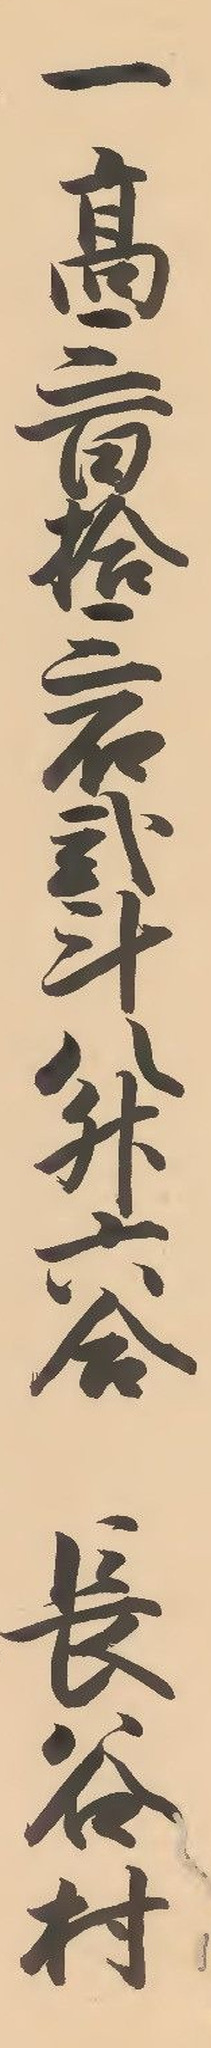一髙三百拾三石弐斗八升六合長谷村
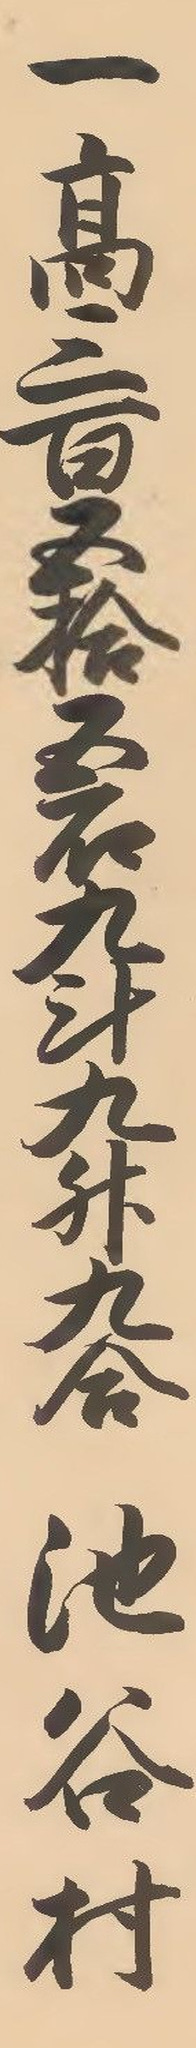一髙三百五拾五石九斗九升九合池谷村
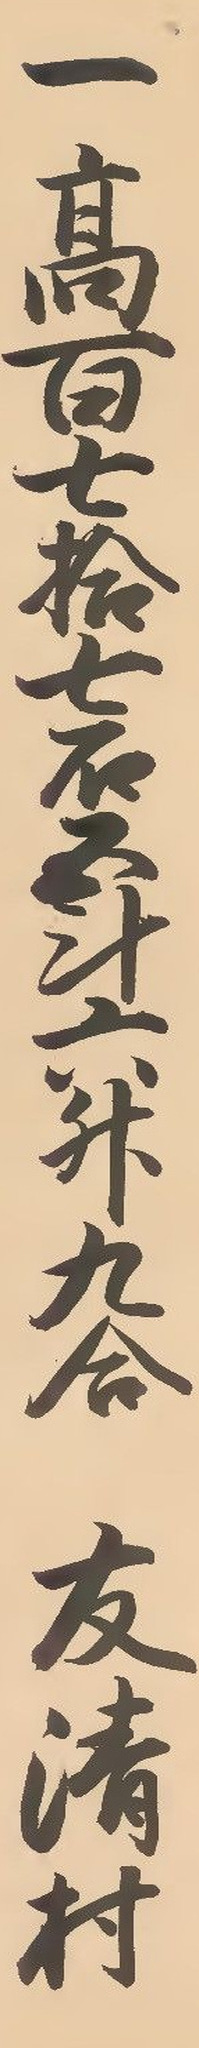一髙百七拾七石五斗六升九合友清村
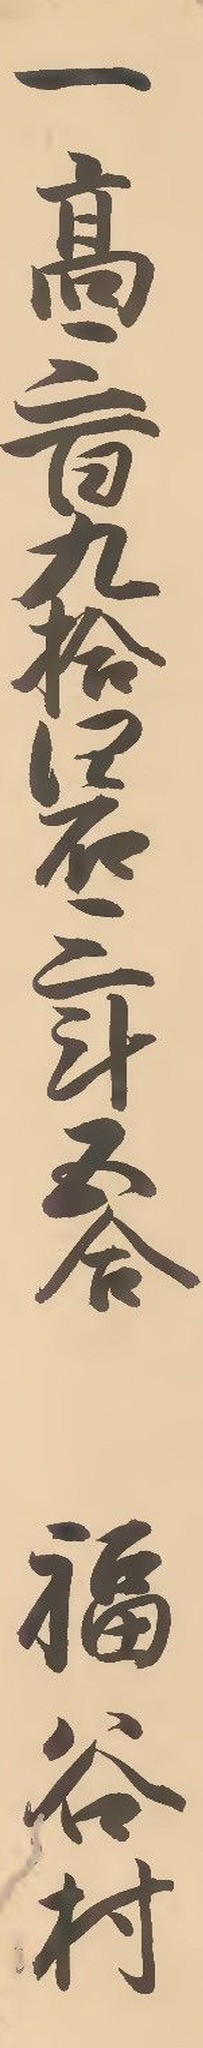一髙三百九拾四石三斗五合福谷村
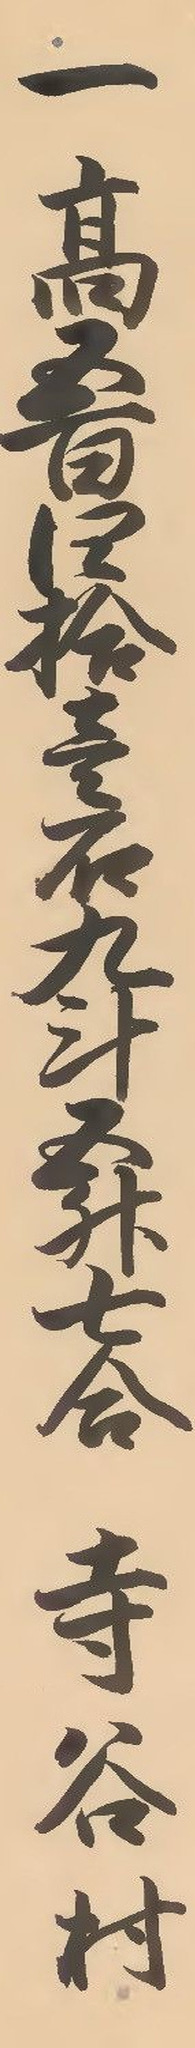一髙五百四拾壱石九斗五升七合寺谷村
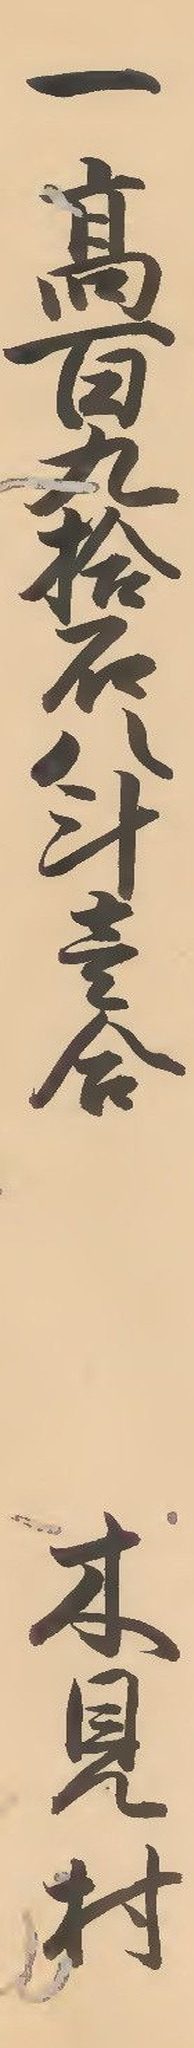一髙百九拾石八斗壱合木見村
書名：播磨国郷帳
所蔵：国立公文書館 National Archives of Japan
